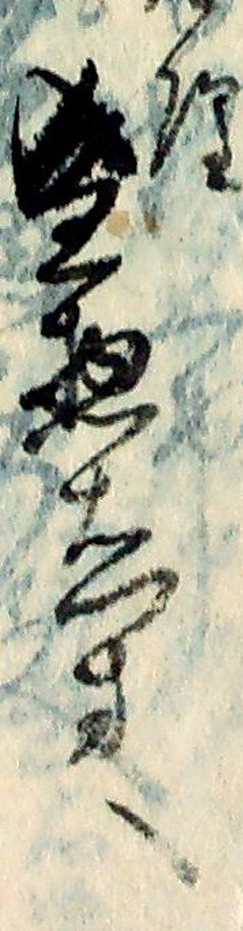盛惣右衛門方へ
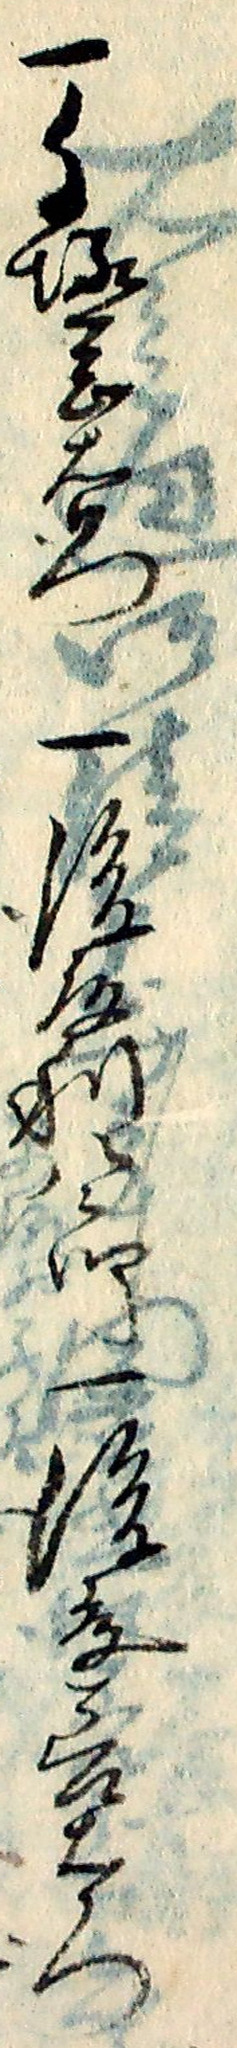一手塚甚右衛門一後藤利八郎一後藤善右衛門
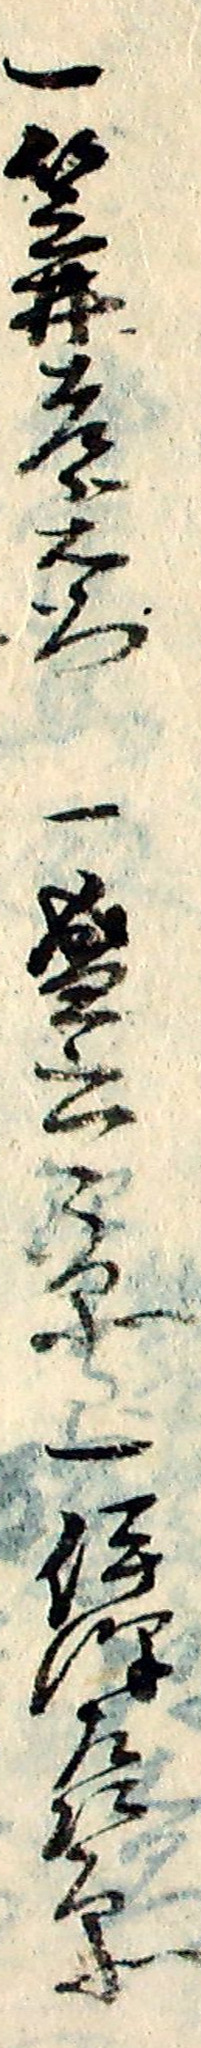一笠井吉郎右衛門一盛六兵衛一伊沢左次兵衛
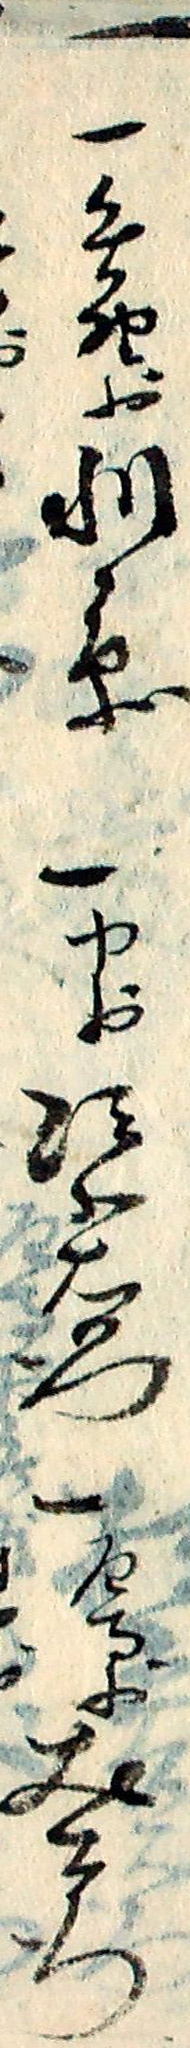一矢野村利兵衛一中村次郎右衛門一尼寺村丈右衛門

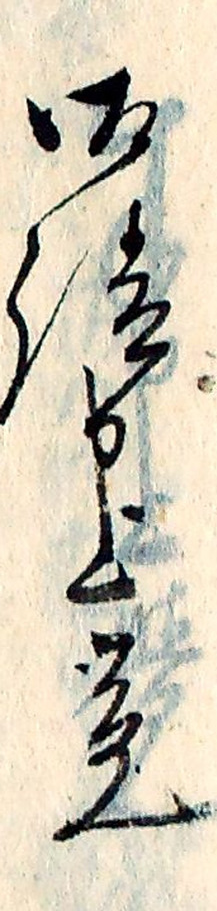御請申上覚
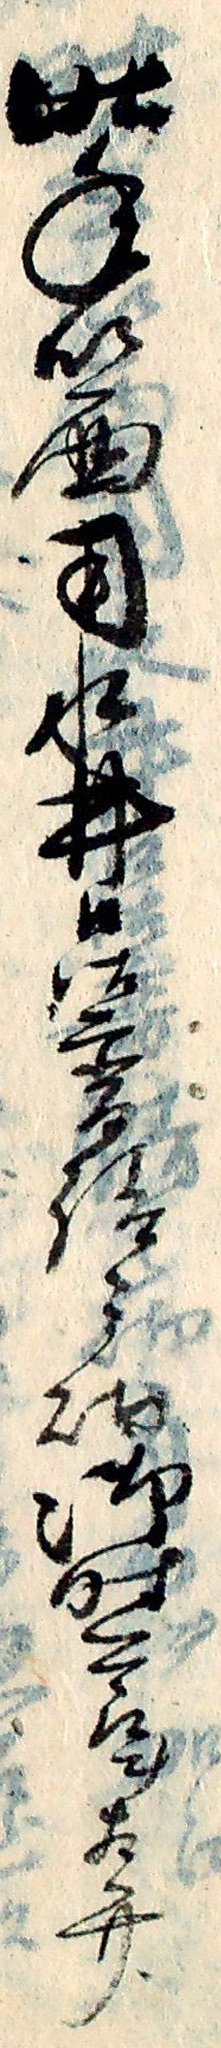昨年以西用水井口御普請之砌御時節を相弁
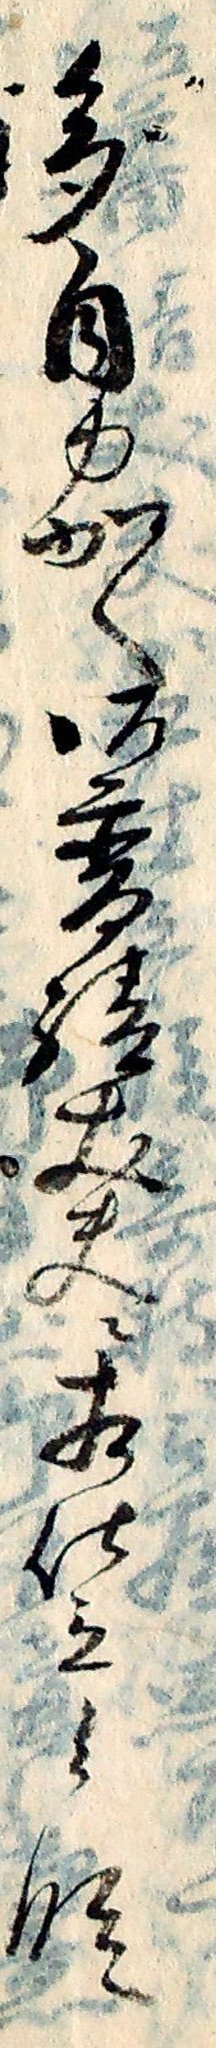多自力加へ御普請丈夫に相仕立之段
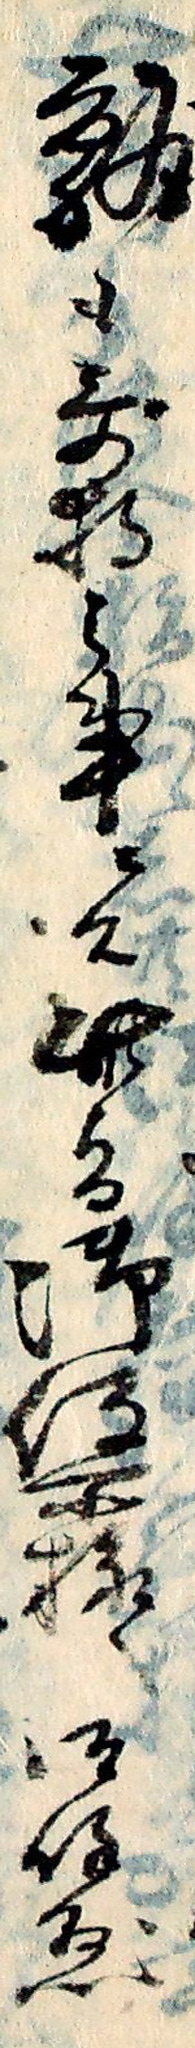孰も奇特之事に候此旨御役所様へ御呼懸
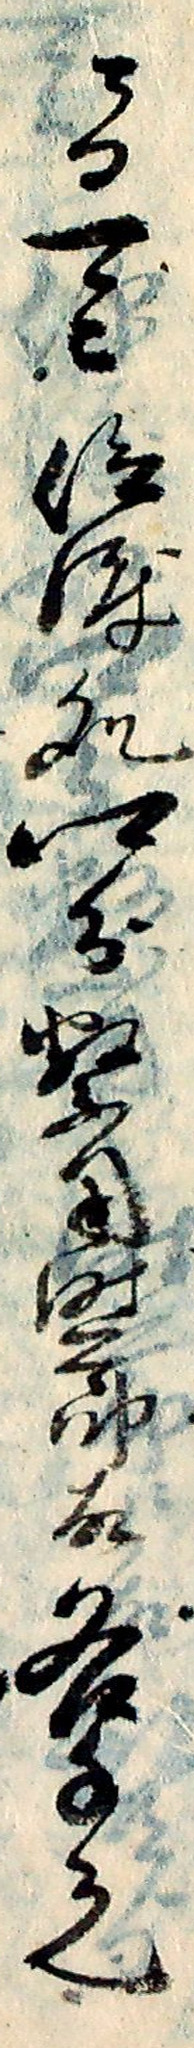にて可被仰渡処郷分繁用時節故各手元
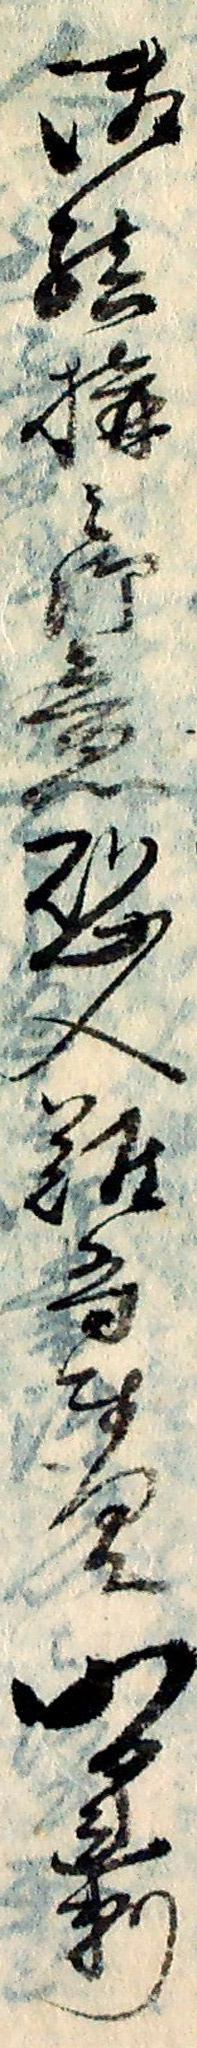御結構之御意恐入難有奉存候仍て連判
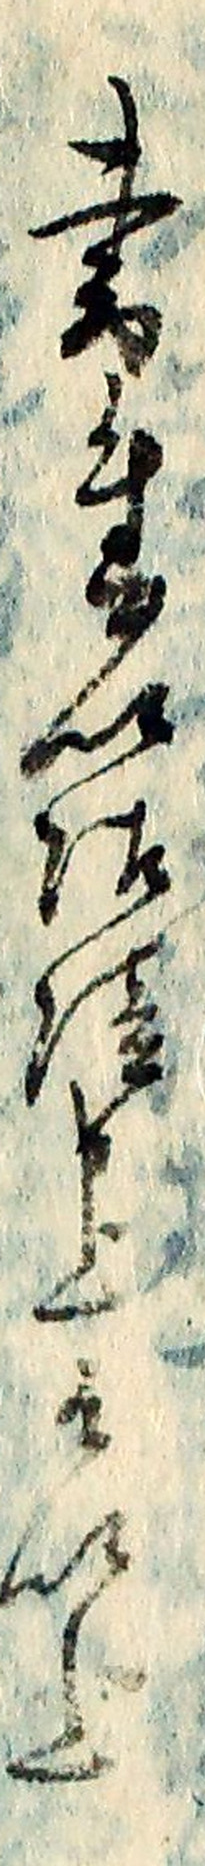書付を以御請申上候以上
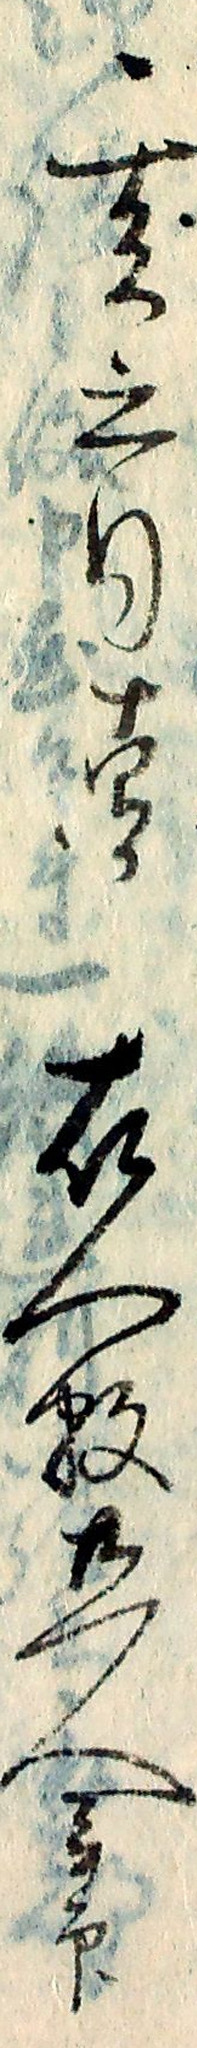亥六月十四日右人数廿一人実印
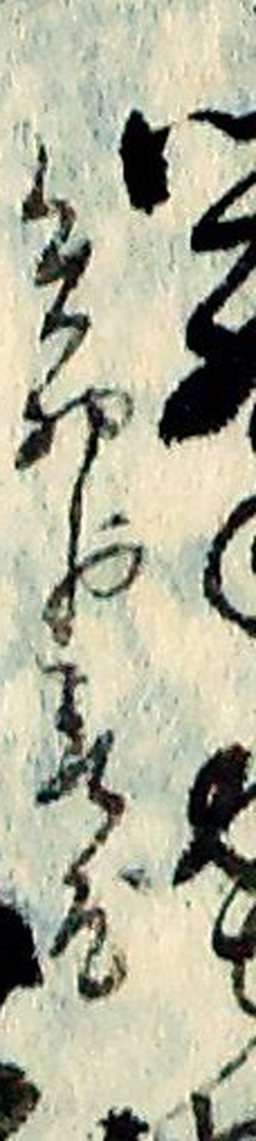矢野村庄屋
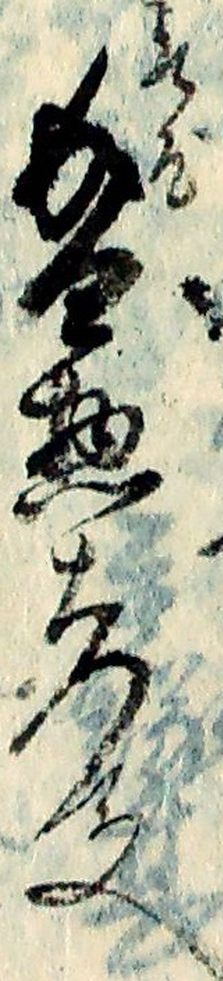盛惣右衛門殿
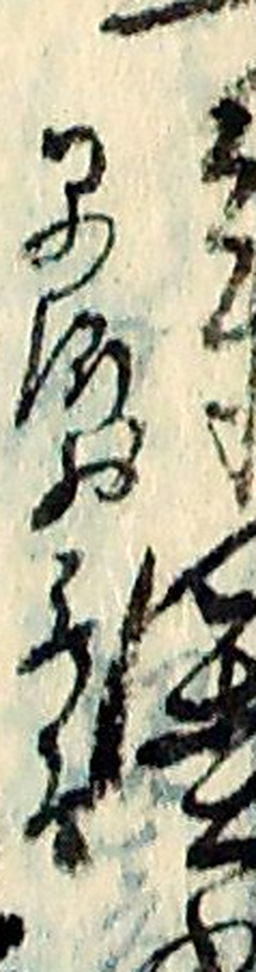早淵村庄屋
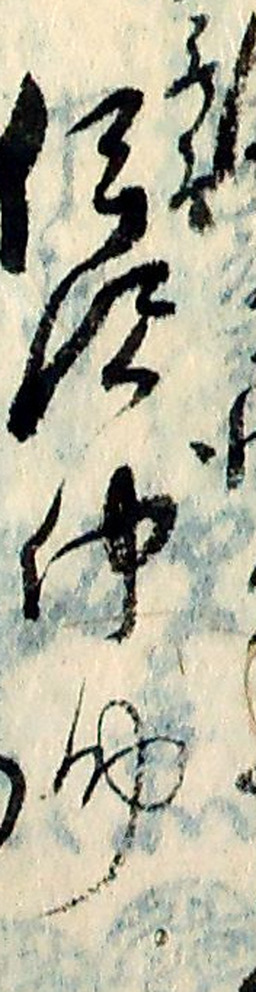伊沢仲助
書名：諸御願書控(後藤氏壱番）
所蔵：鳴門教育大学 Naruto University of Education
